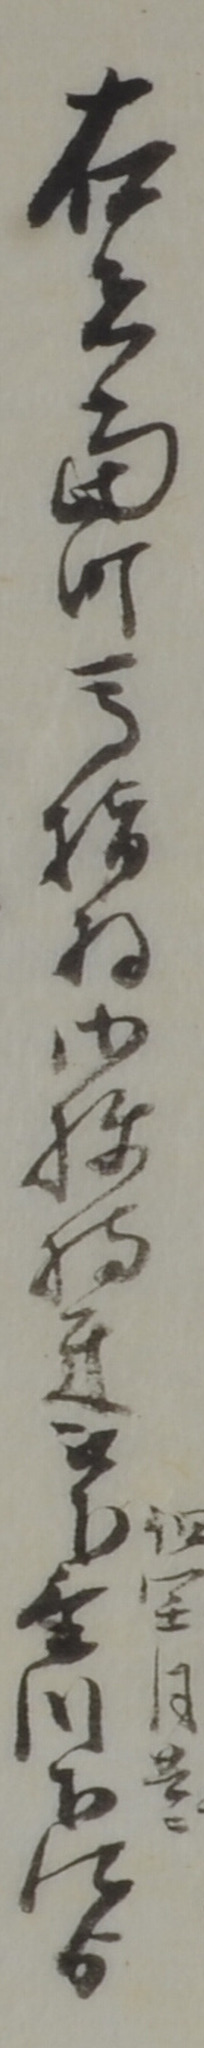右者当町馬指為御扶持米被下置川下郷ゟ
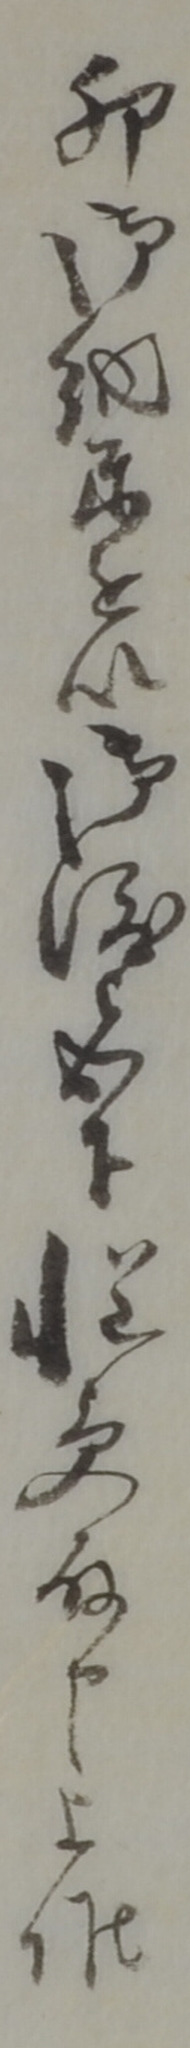卯御納米を以御渡被成下慥受取申上候
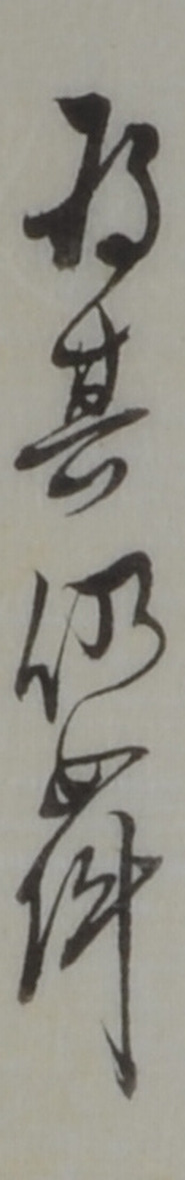為其仍如件
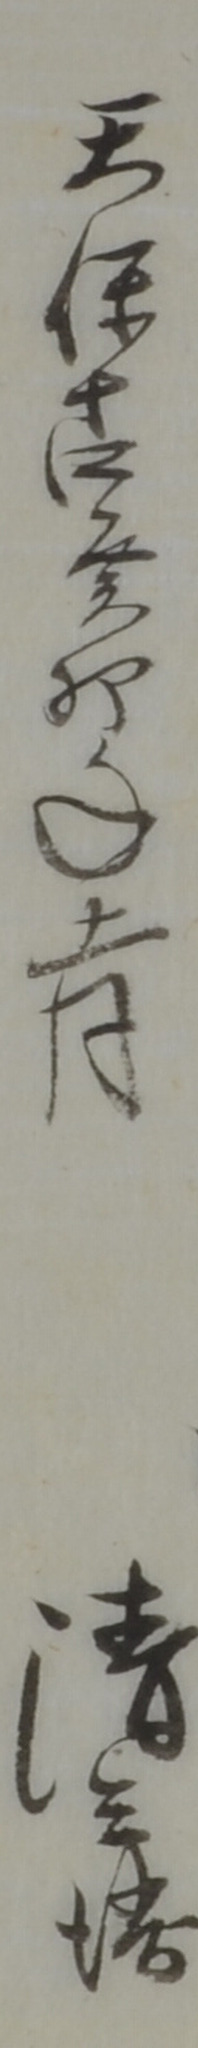天保十四年癸卯年十一月清兵衛
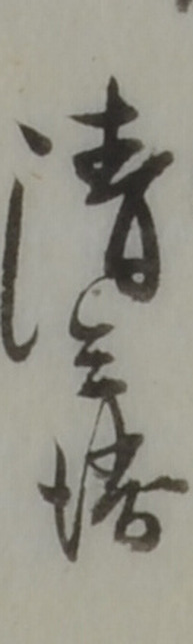清兵衛
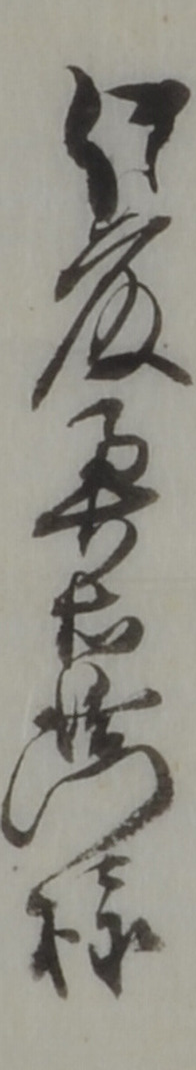伊藤奥右衛門様
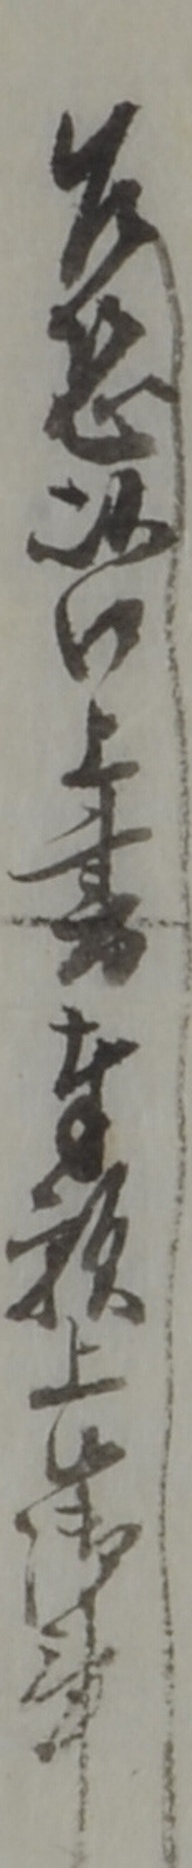乍恐以口上書奉願上候御事
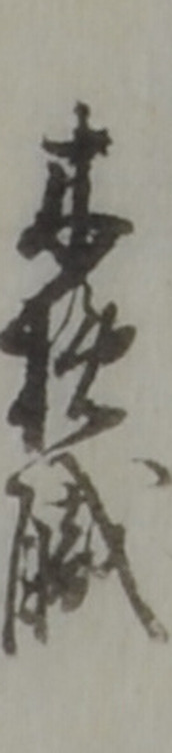木挽職
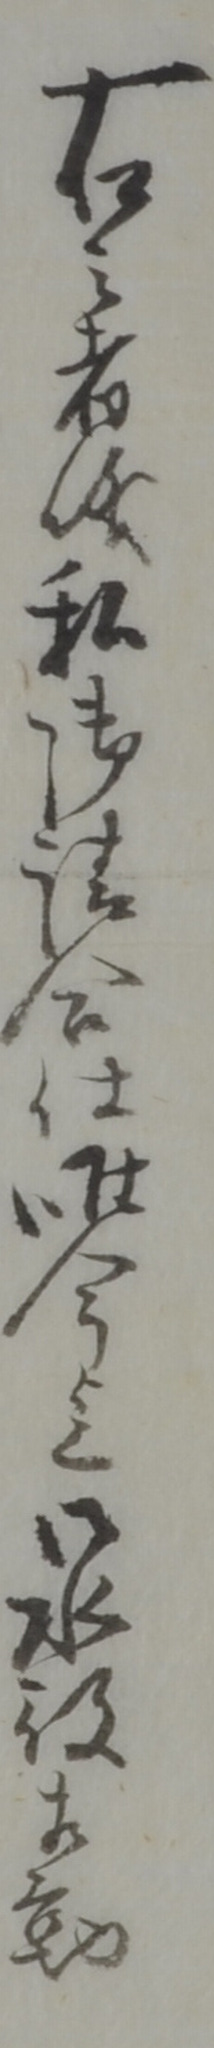右之者儀私御請合仕唯今迄御水役相勤
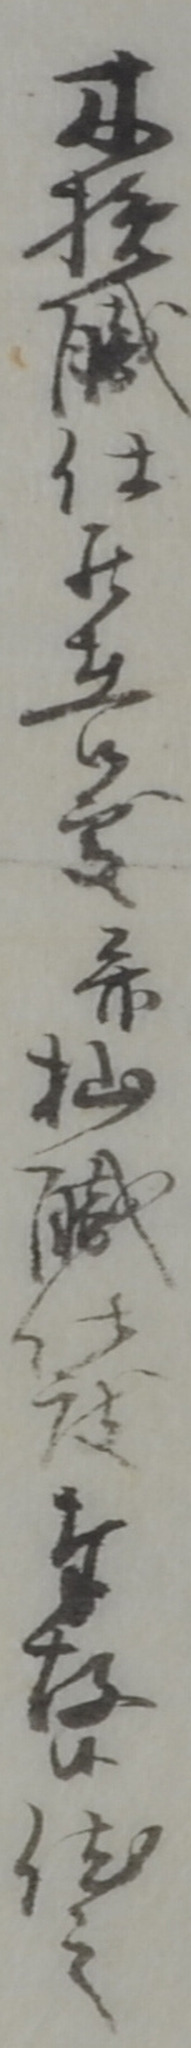木挽職仕罷在候處幷杣職仕度奉存候依之
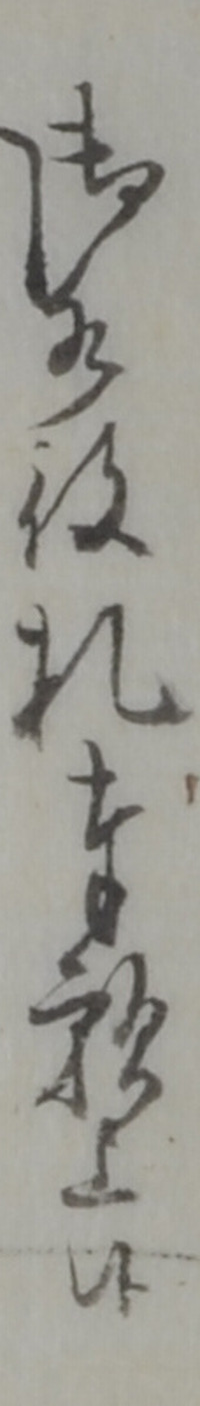御水役札奉願上候
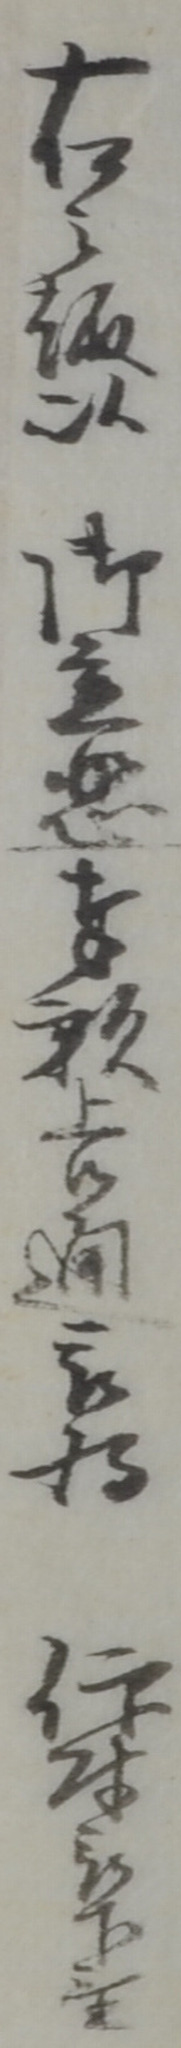右之趣以御慈悲奉願上候通被為仰付被下置

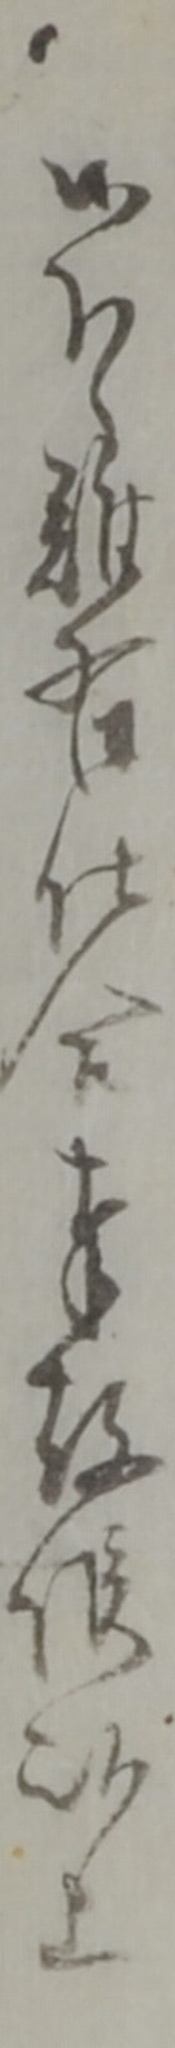候ハヽ難有仕合奉存候以上
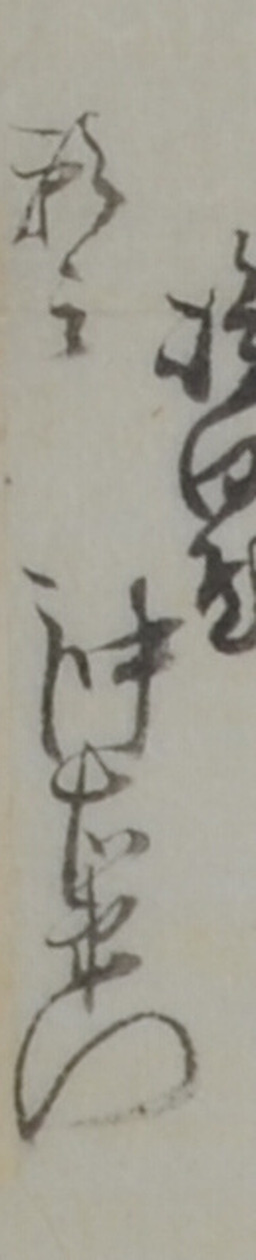願主沖右衛門
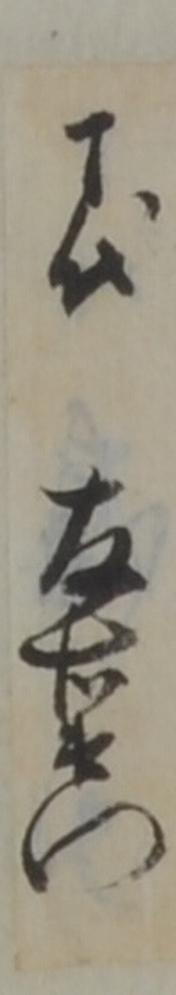丁代友右衛門
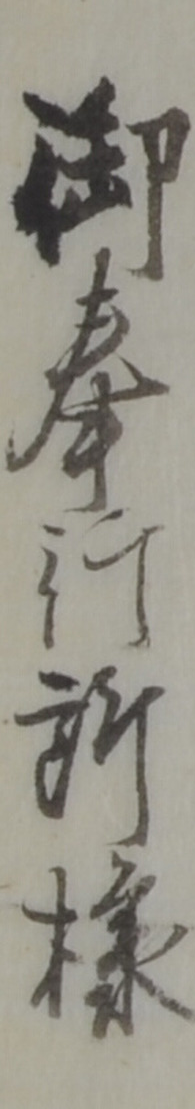御奉行所様
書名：諸願書控簿
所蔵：伊那市立高遠町図書館・合同会社AMANE
